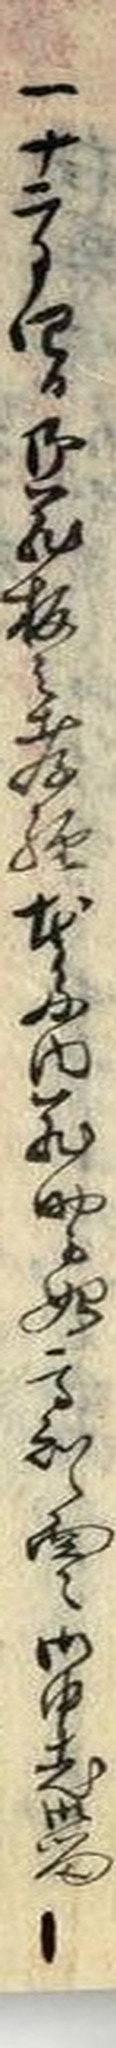一十二月四日御蔵板之孝経本多内蔵助方始高知之面々御中老御留
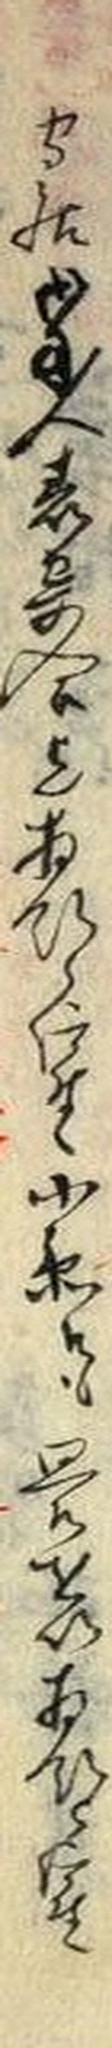守居御用人表寄合迄拝領被仰付候小兵衛江も思召を以拝領被仰付候

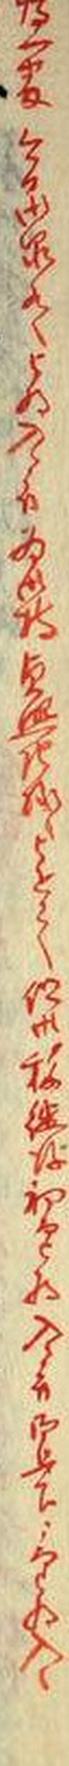一鴨一番今日御泉水へ被為入候ニ付為御持貞照院様へ被進之但御移徒後初而為入候ニ付御上下ニ而被為入候
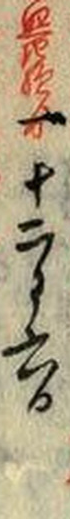一十二月六日
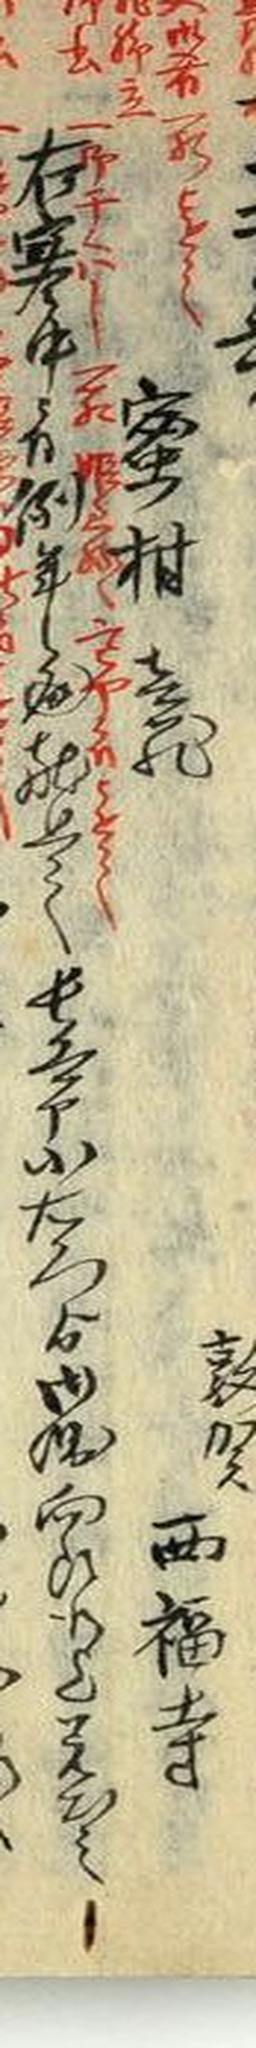右寒中ニ付例年之通献上之長谷部小右衛門ゟ御側向頭取迄差出之
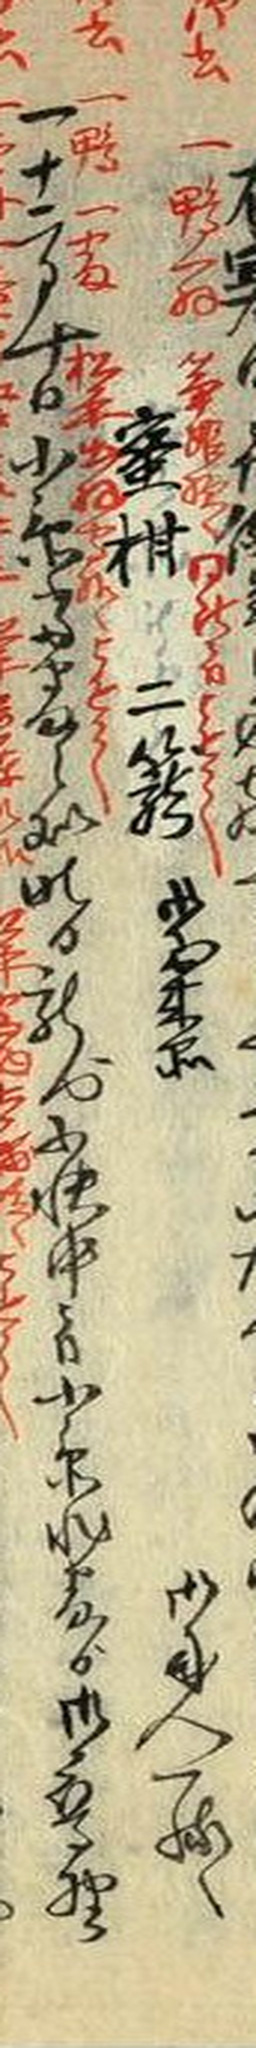一十二月十日小兵衛当番之処昨日新右衛門不快中ニ付小兵衛非番ゟ御鷹野
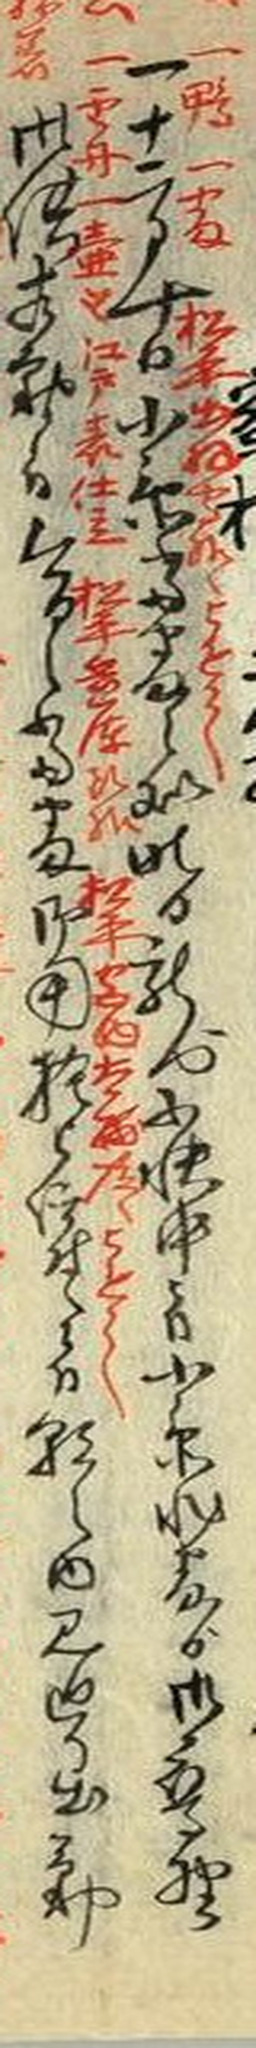御供相勤候ニ付今日之当番御用捨被仰付候ニ付朝之内見廻り出勤
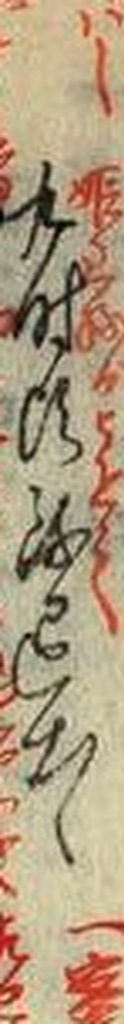九時頃致退出候
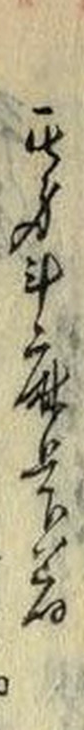其身斗麻上下着
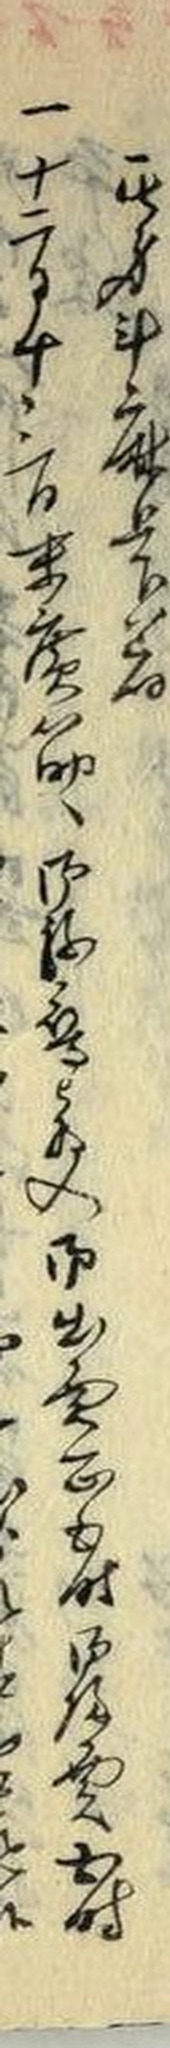一十二月十三日末広筋へ御放鷹被為入御出殿正五時御帰殿五時
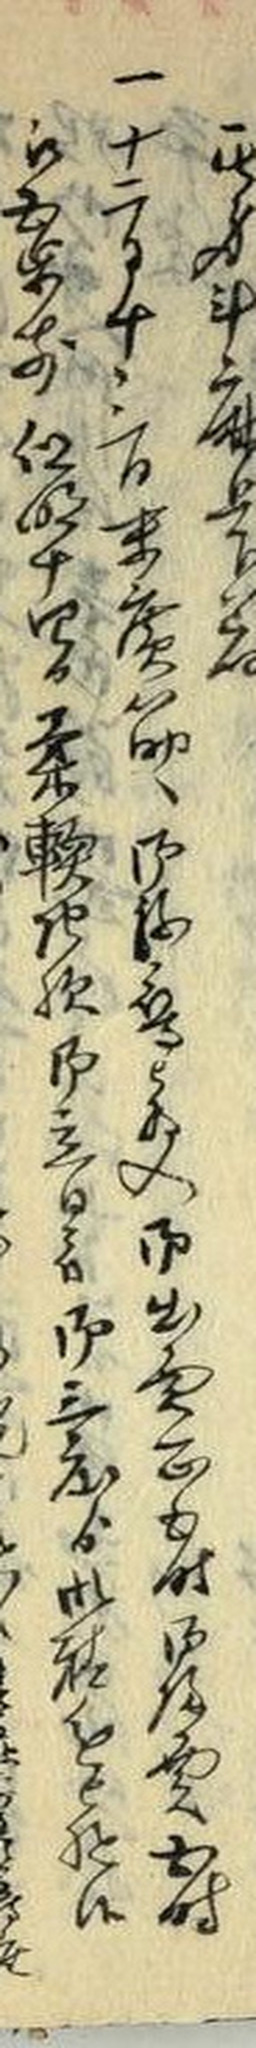江五歩前但明十四日柔輭院様御立日ニ付御三度ゟ御精進被遊候
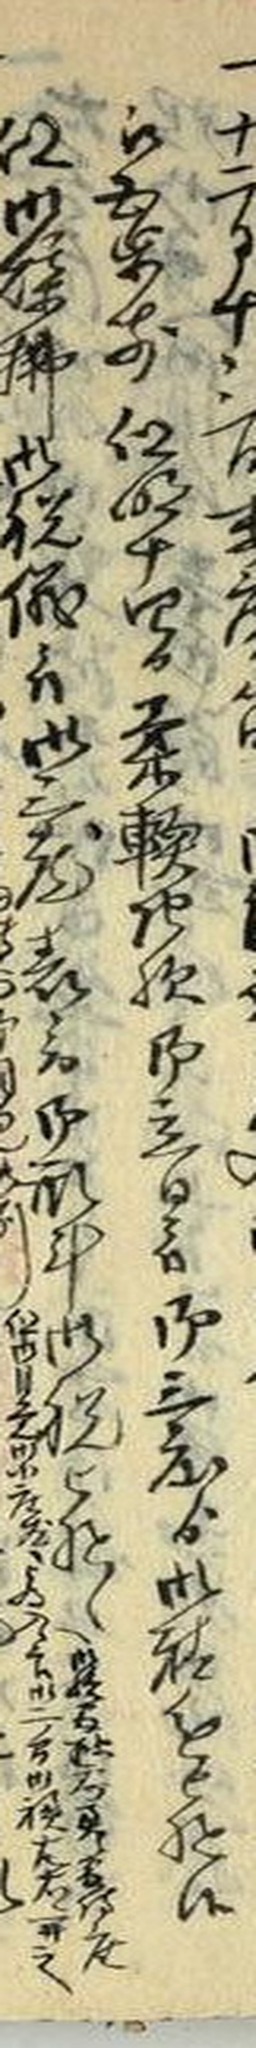但御煤払御祝儀ニ付御三度表ニ而御形斗御祝被遊候
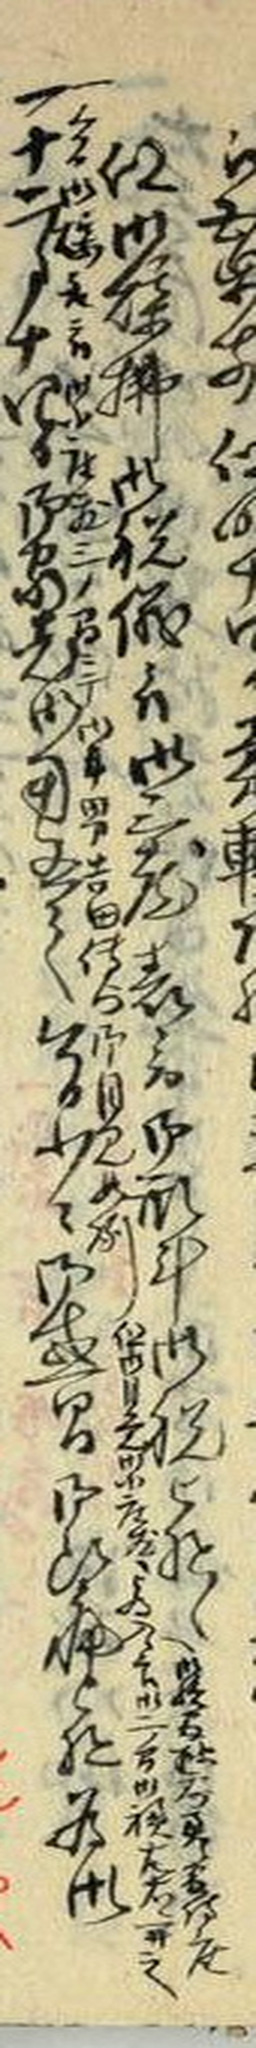一十二月十四日御家老御用有之今日少々御感冒御頭痛被遊為御
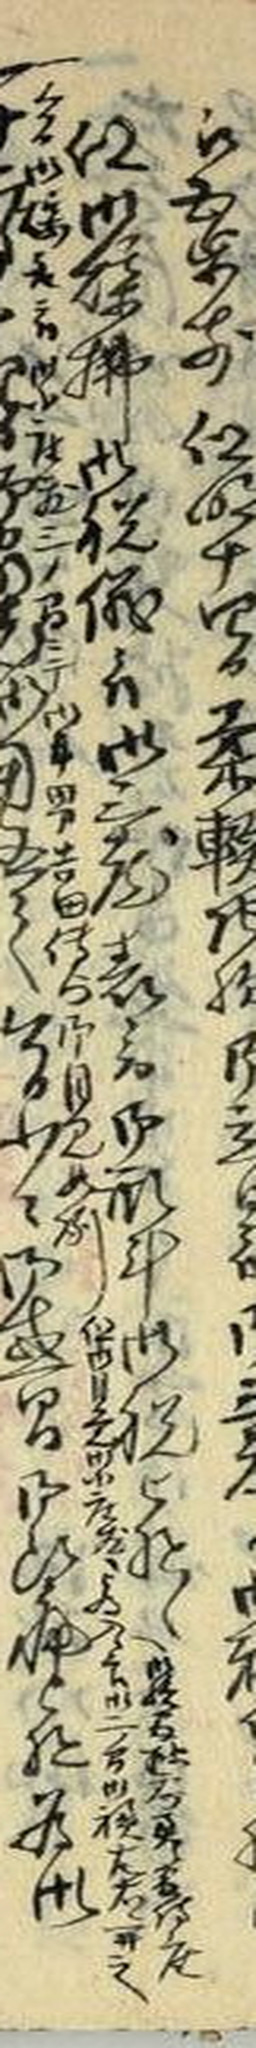一十二月十四日御家老御用有之今日少々御感冒御頭痛被遊為御
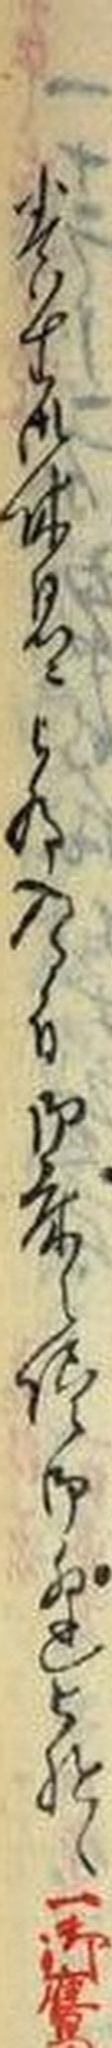養生御休息ニ被為入候ニ付御床之儘御逢被遊候
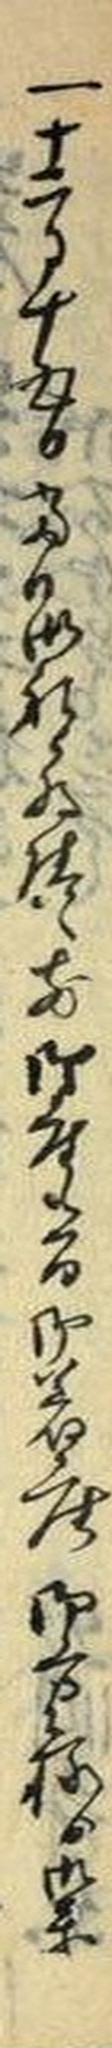一十二月十五日当日御礼被為請候前御座之間御着座御方々様ゟ御参
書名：少傅日録抄（斉承付側向頭取日記、在国）
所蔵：福井県文書館 Fukui Prefectural Archives
